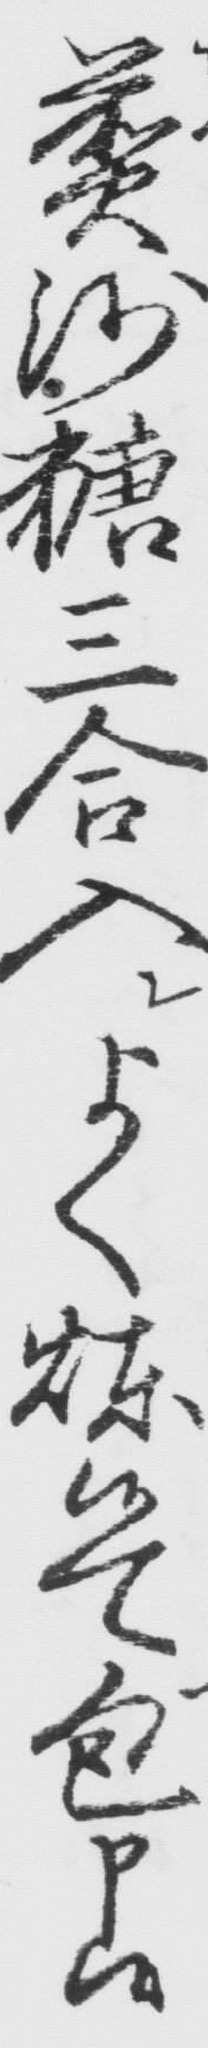煎沙糖三合入れよく煉候て包申候
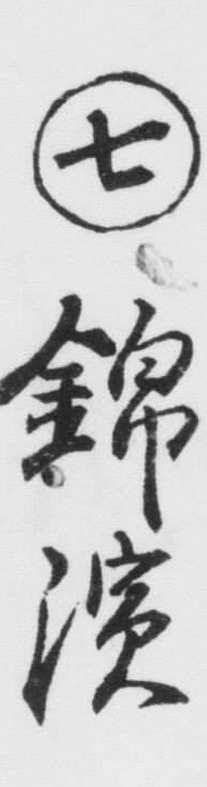(七)錦浜
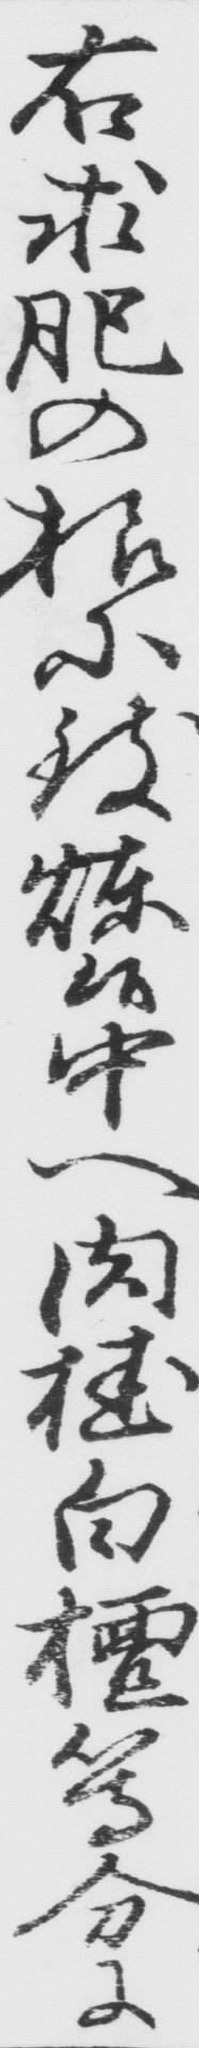右求肥の様に致煉候中へ肉桂白檀等分に
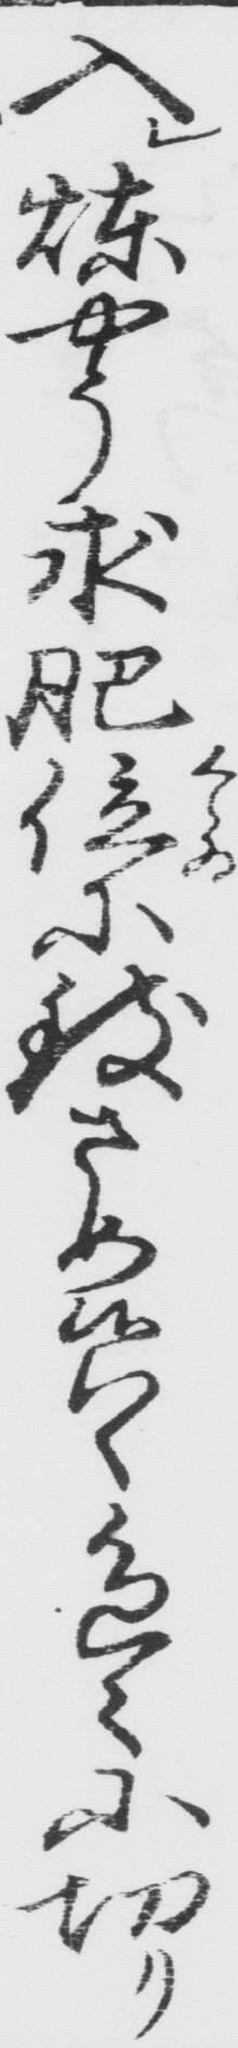入れ煉やう求肥位に致さめ候はゝ色々に切り
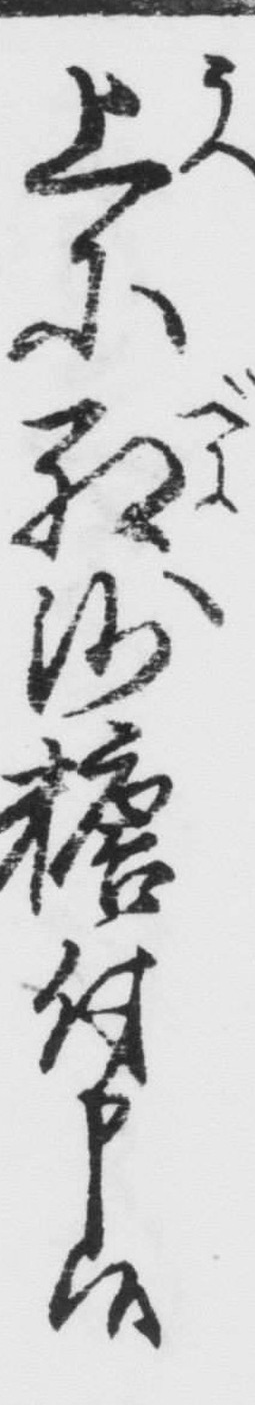上に紅沙糖付申候
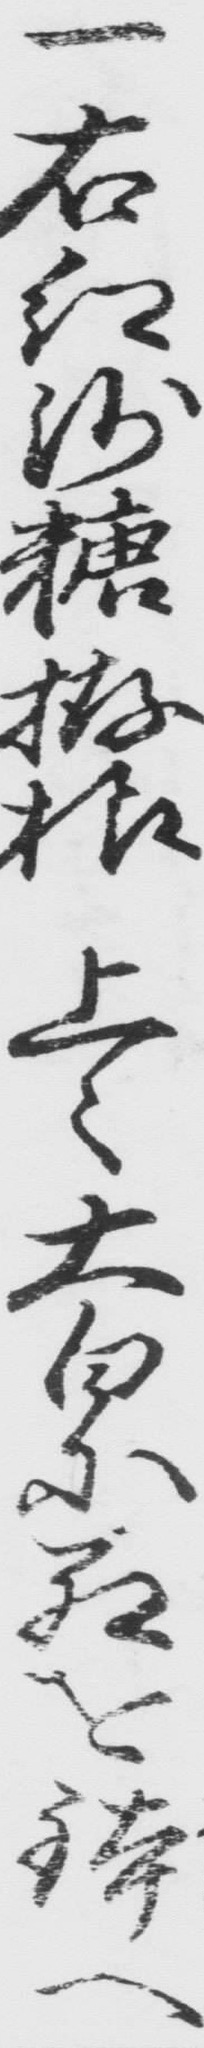一右紅沙糖拵様上々大白に紅を鉢へ
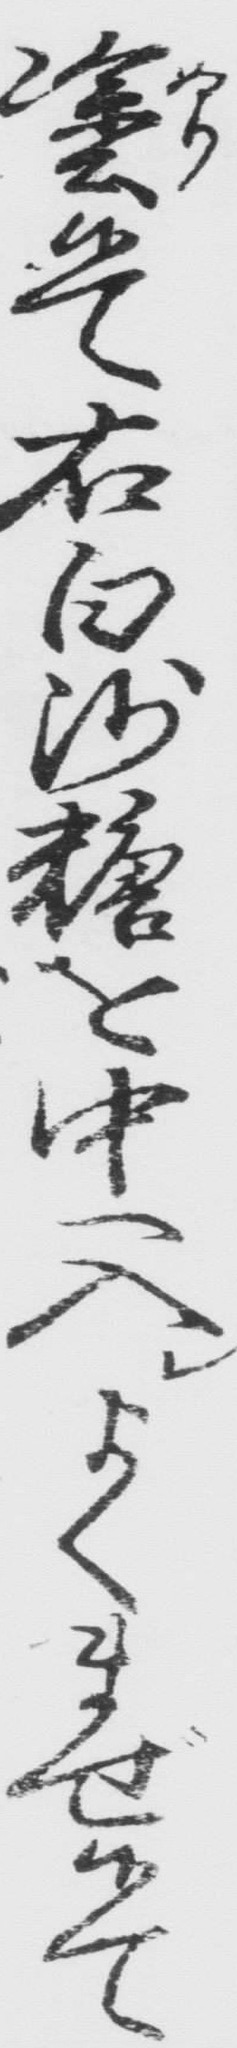塗候て右白沙糖を中へ入れよくまぜ候て
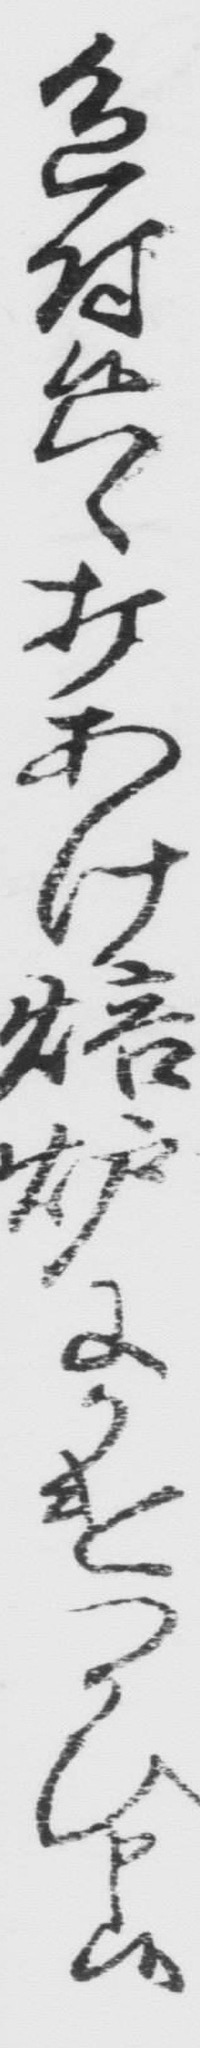色付候はゝ打あけ焙炉にかけつかひ申候

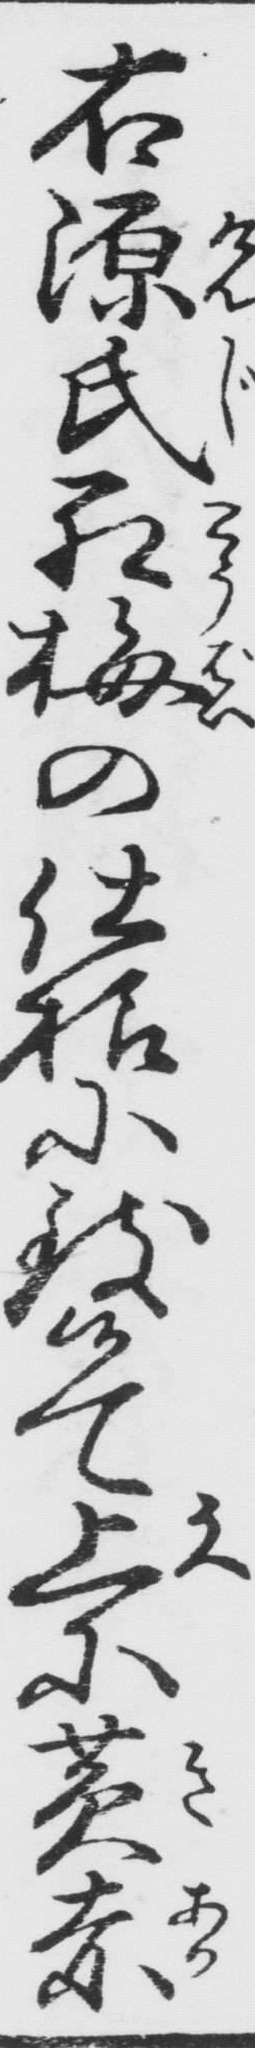右源氏紅梅の仕様に致候て上に黄赤
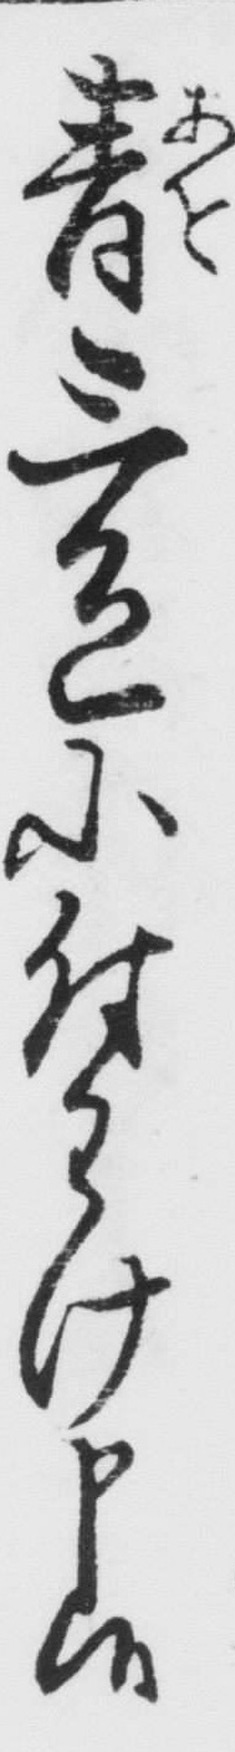青三色に付わけ申候
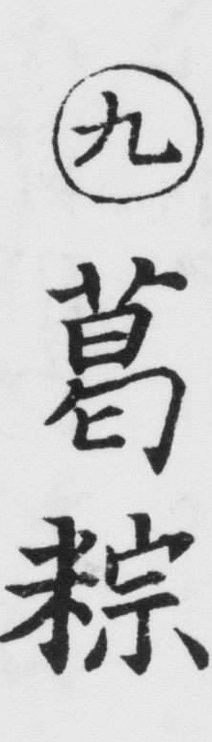(九)葛粽
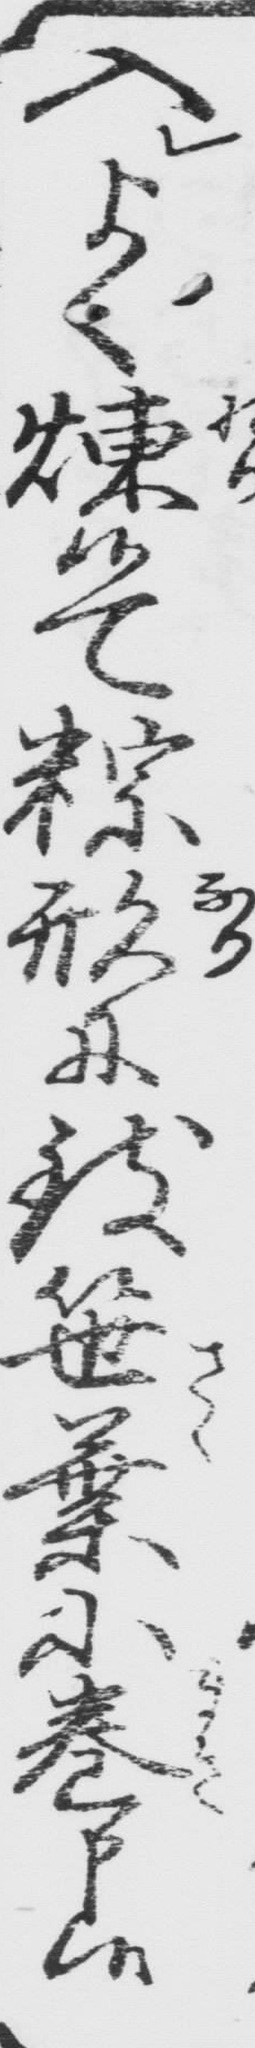入れよく煉候て粽形に致笹葉に巻申候
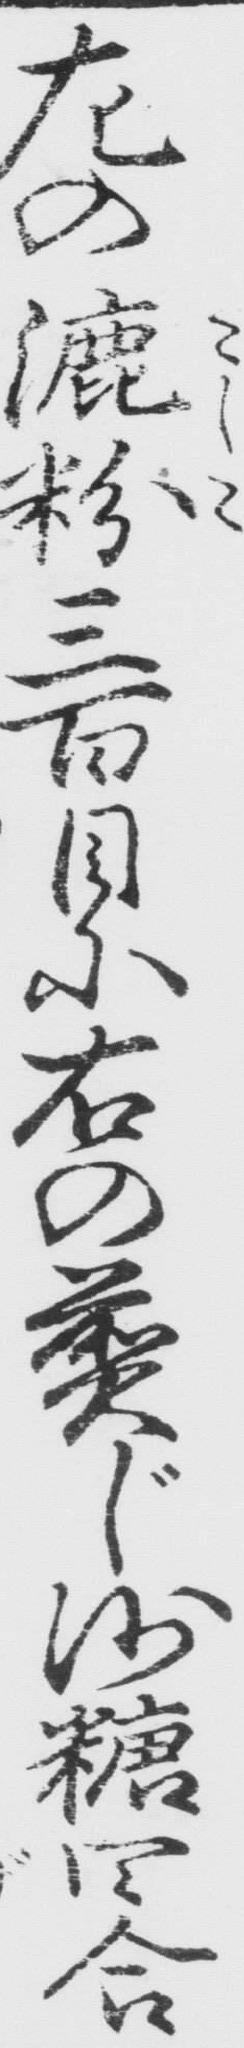左の漉粉三百目に右の煎じ沙糖四合
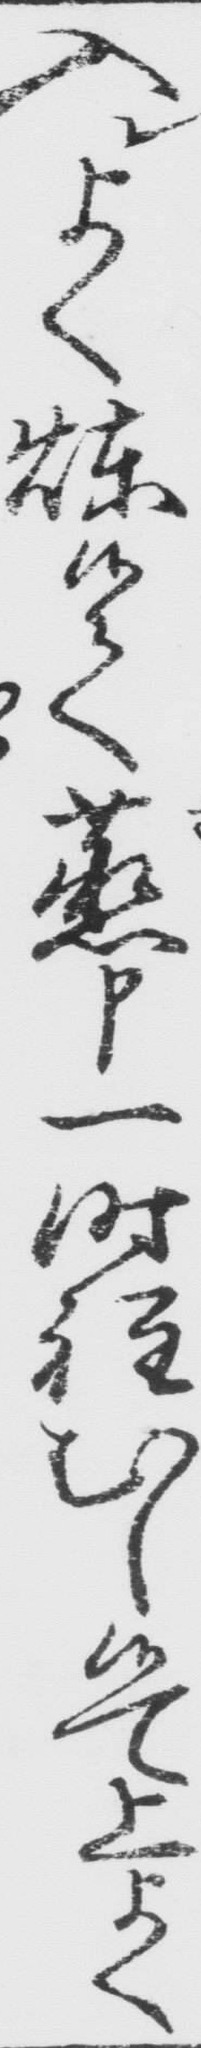入れよく煉候て蒸申一時程むし候て上よく
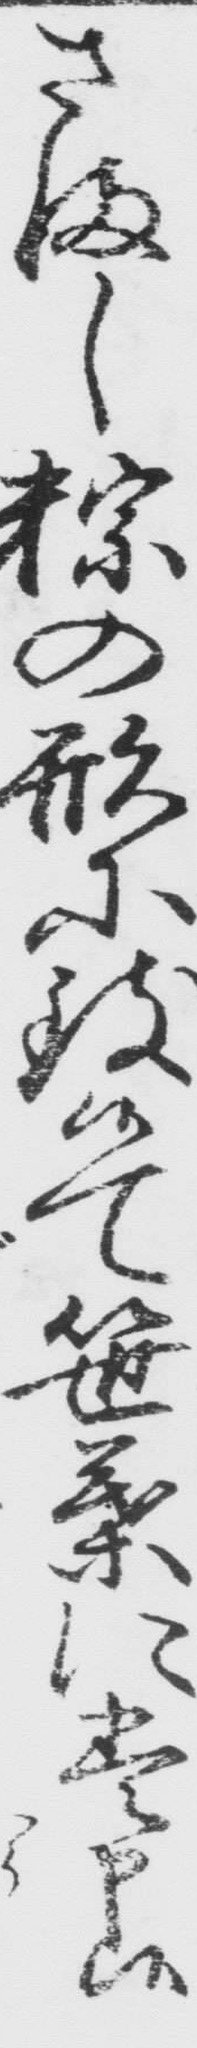さまし粽の形に致候て笹葉に巻申候
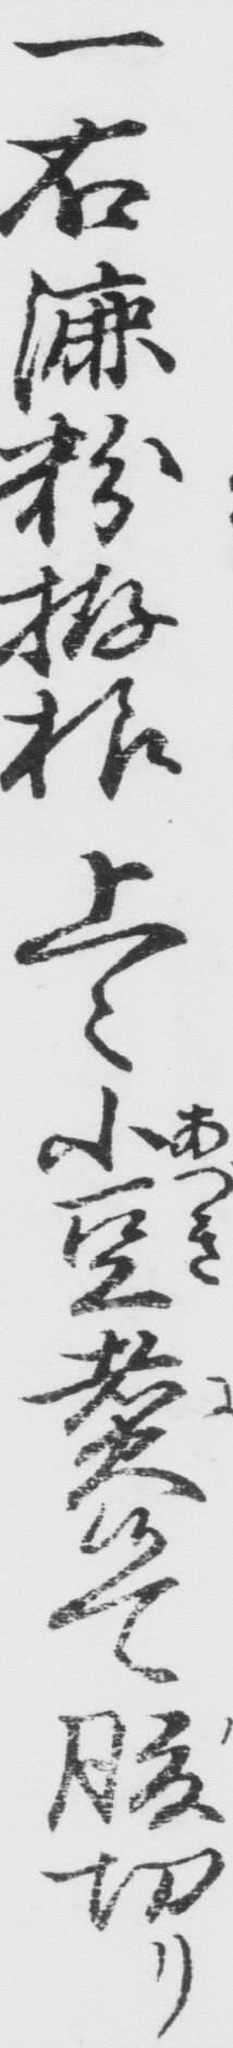一右漉粉拵様上々小豆煮候て腹切り
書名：御前菓子図式
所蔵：大阪府立大学学術情報センター 国文学研究資料館
